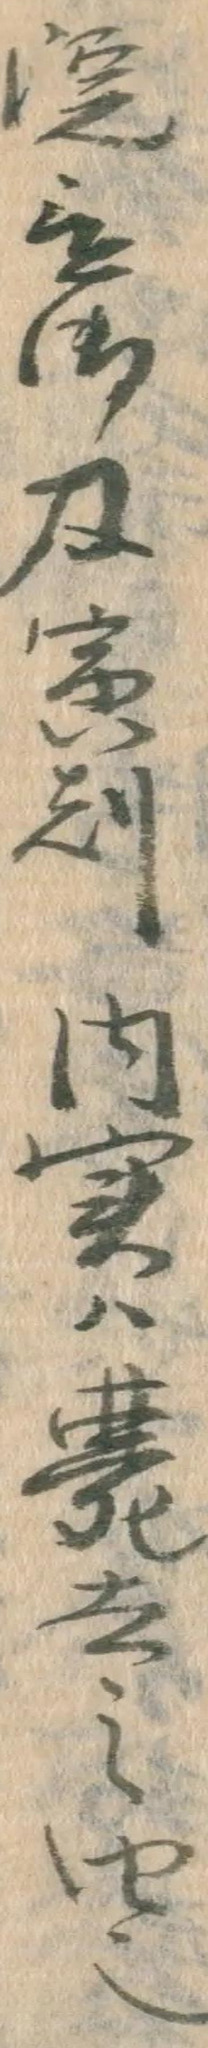院遣御及寅刻、内実ハ薨去之由也、
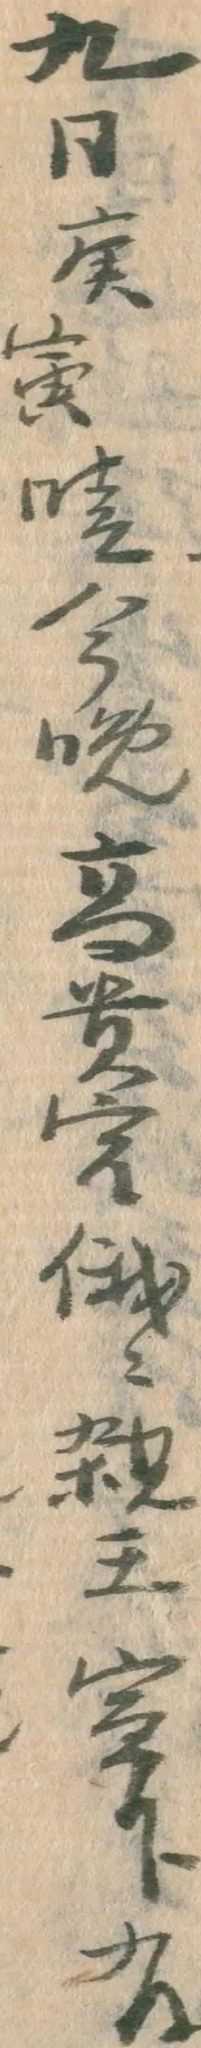九日庚寅晴、今晩高貴宮俄二親王宣下有
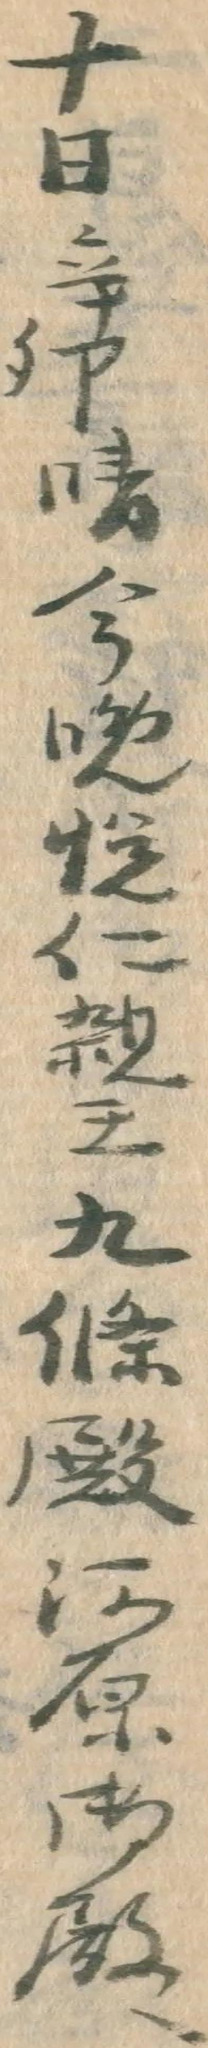十日辛卯晴、今晩悦仁親王、九條殿河原御殿へ
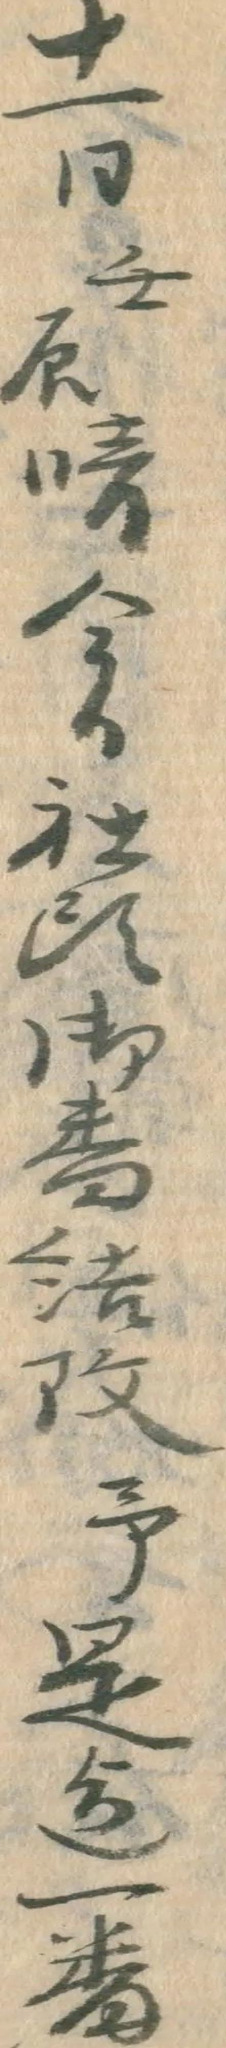十一日壬辰晴、今日社頭御番結改、予是迄一番

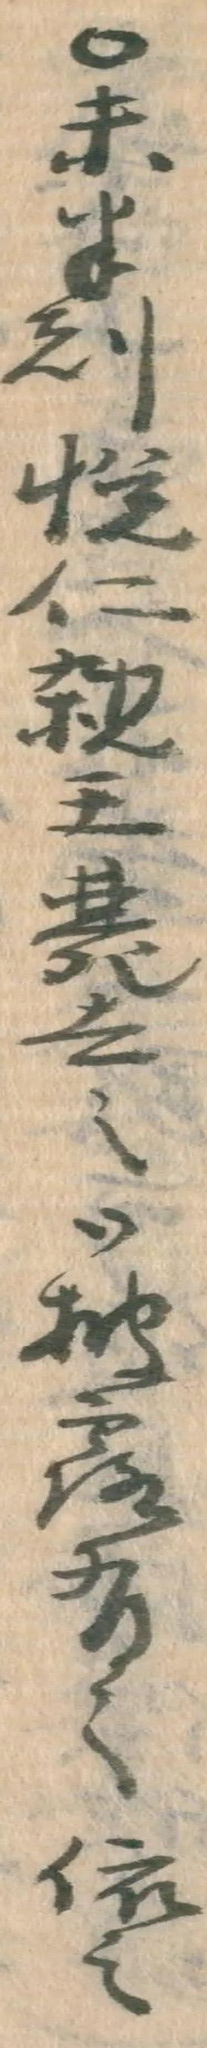〇未半刻、悦仁親王薨去之御披露有之、依之
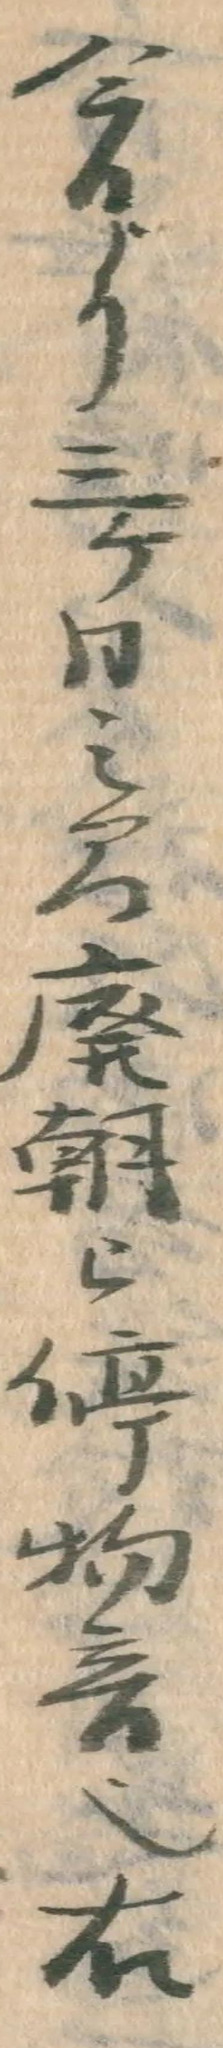今日より三ケ日之間廃朝、被停物音也、右
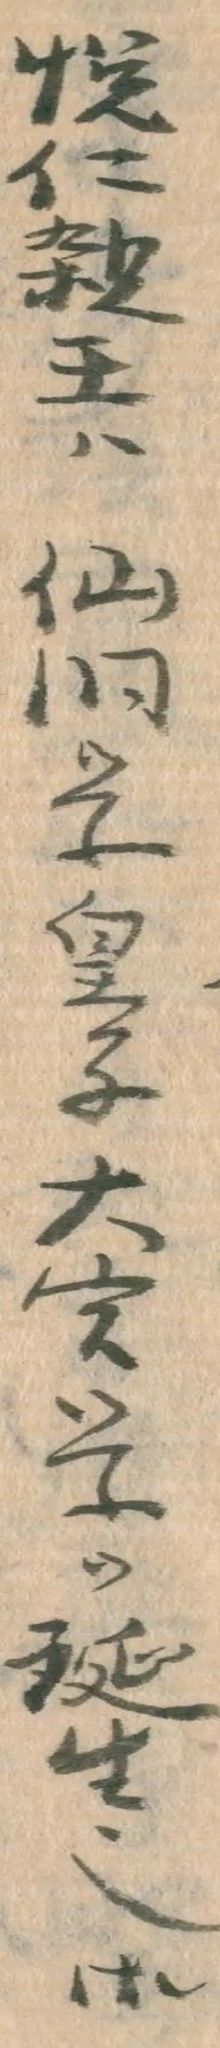悦仁親王ハ仙洞御所皇子、大宮御所御誕生也、御
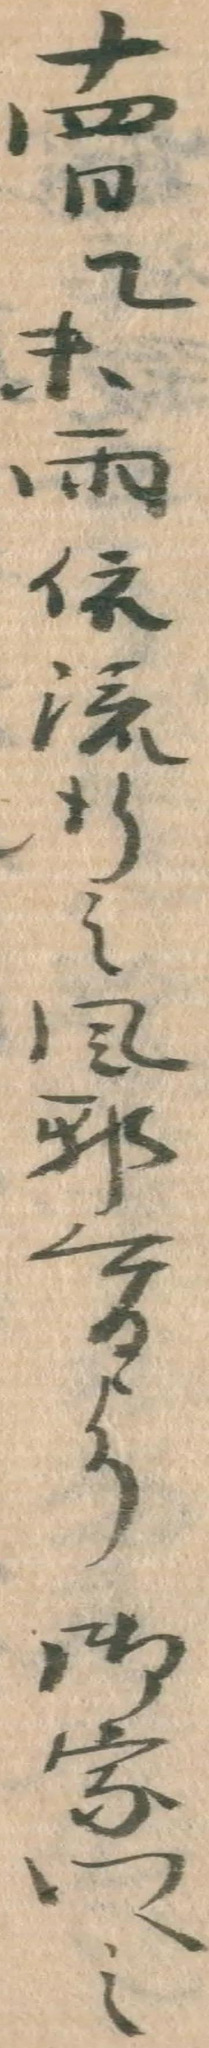十四日乙未雨、依流行之風邪、今日より御家門へ之
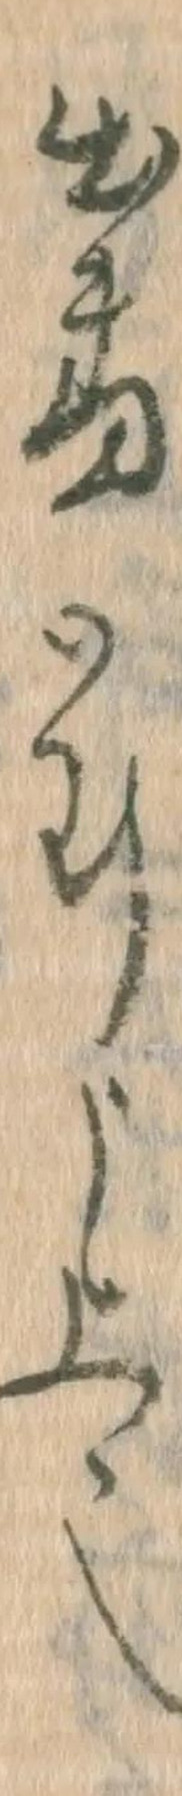出番御断申上也、
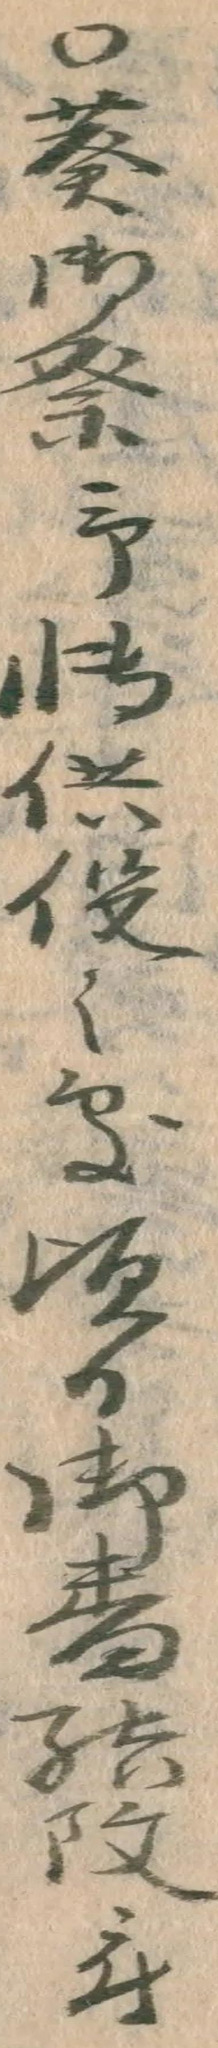○葵御祭予御轉供役之處、頃日御番結改ニ付
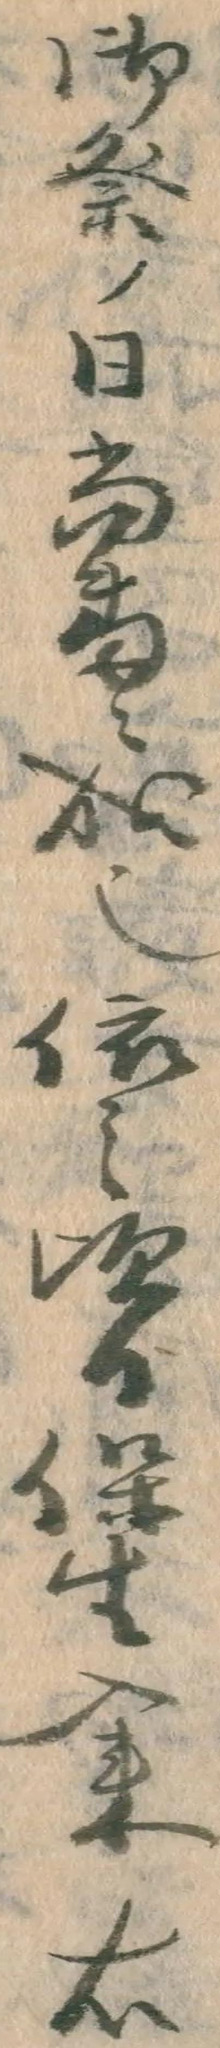御祭ノ日當番ニ成也、依之頃日保生入来、右
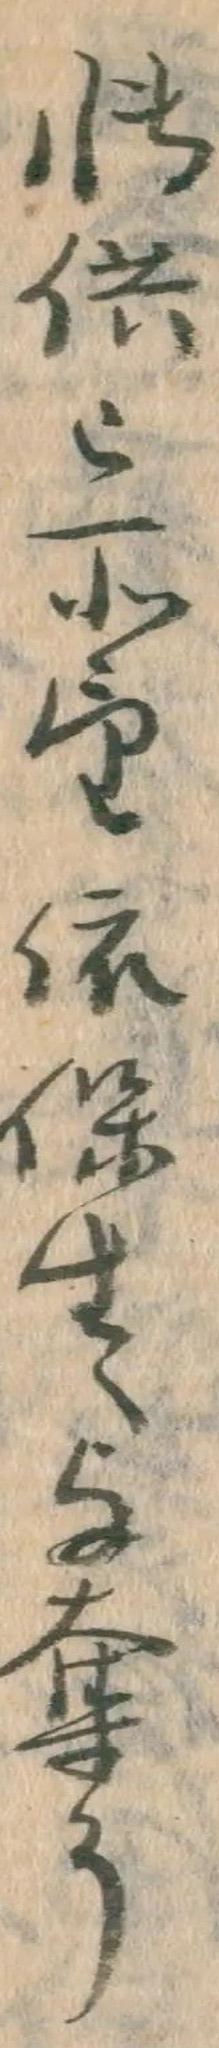轉供被所望依、保生へ与奪了、
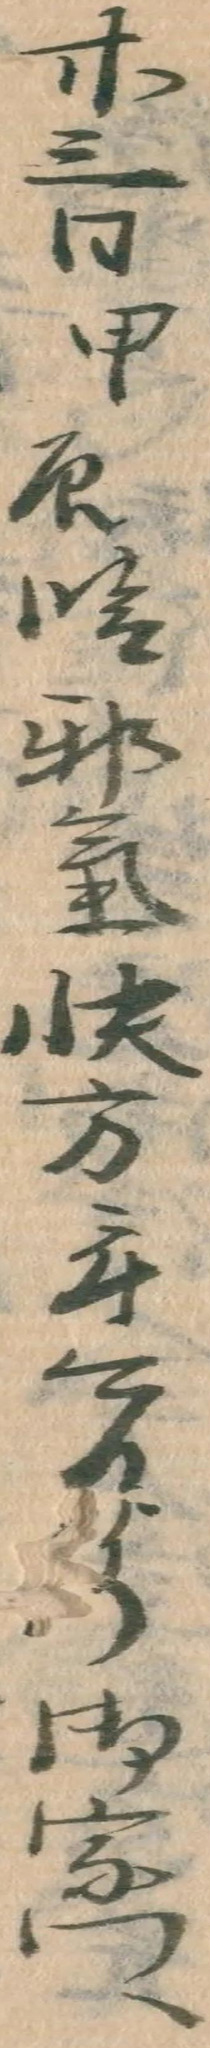廿三日甲辰晴、邪気快方ニ付、今日より御家門へ
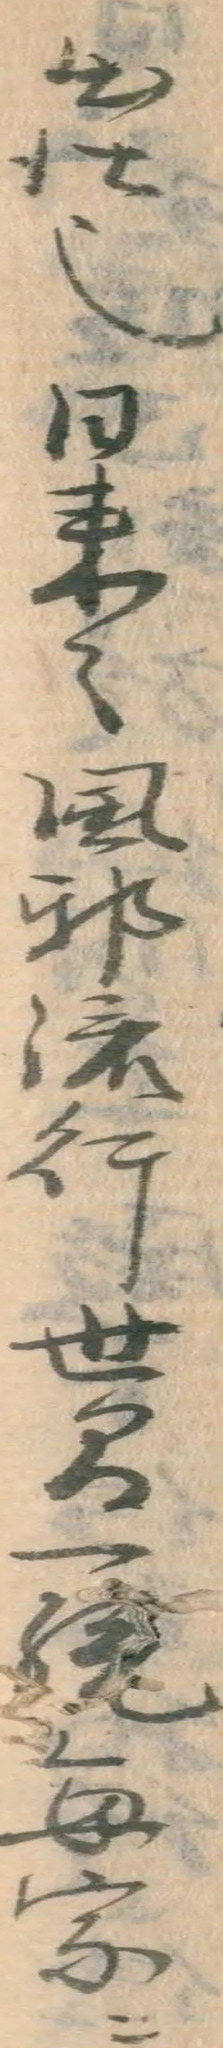出仕也、日来之風邪流行、世間一統毎家ニ
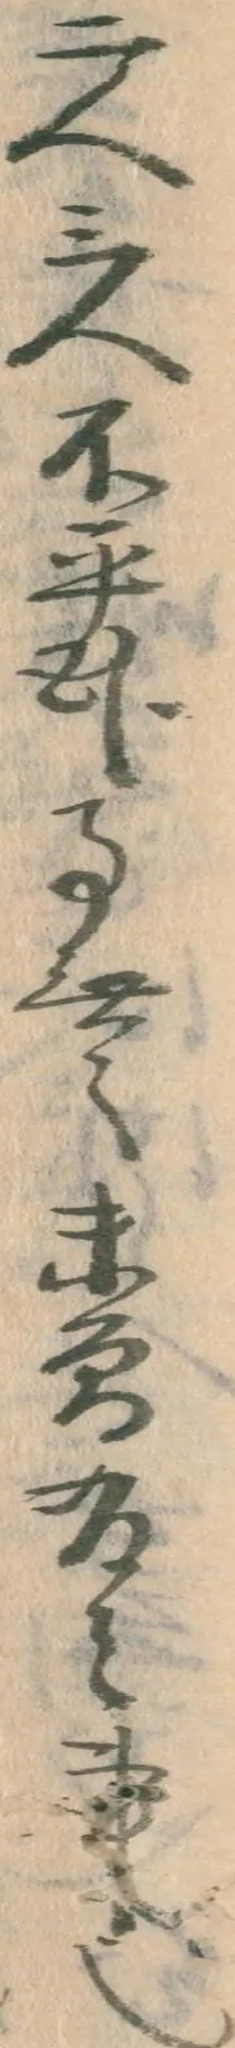二人・三人不平事無之、未曾有之事也、
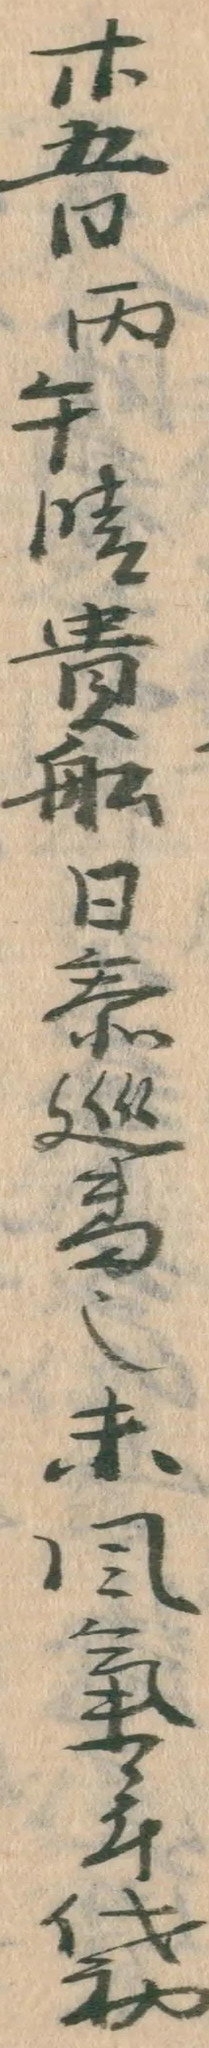廿五日丙午晴、貴船日参巡番也、未風気ニ付、代勤
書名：賀茂社記録. 第63冊
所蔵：国立国会図書館 National Diet Library, JAPAN
